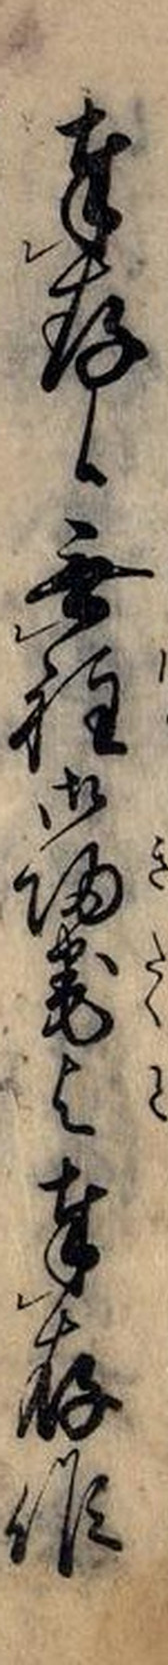奉存候無程御帰宅与奉存候
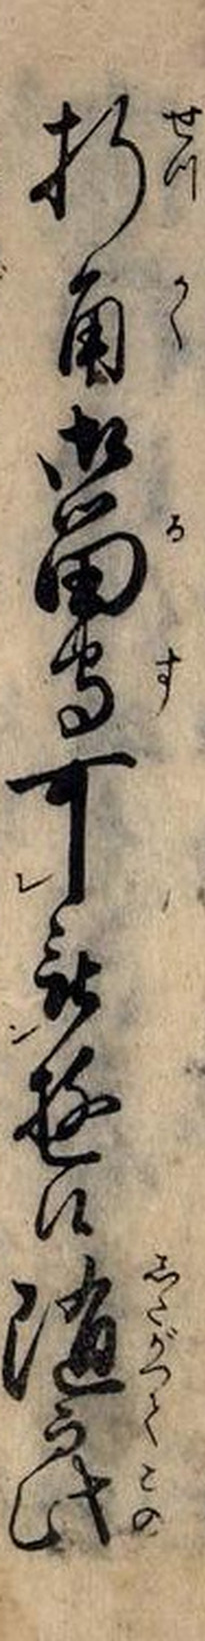折角御留守可被遊候随而此
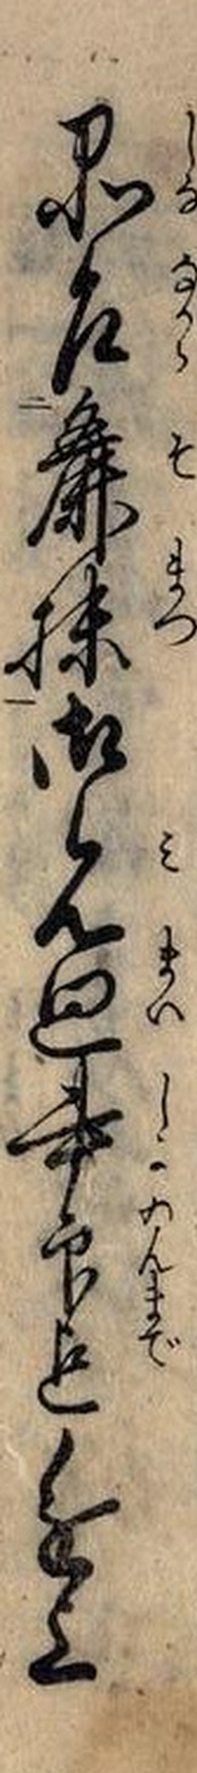品乍麁抹御見廻書印迄進上
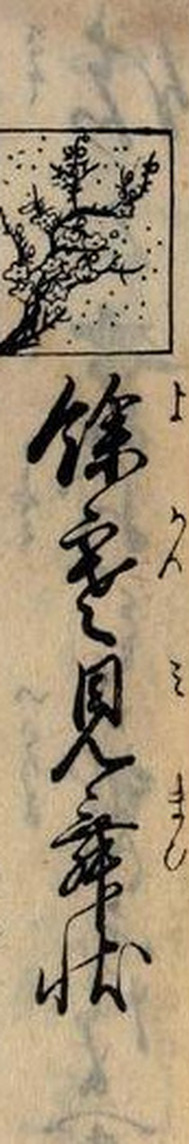餘寒見舞状
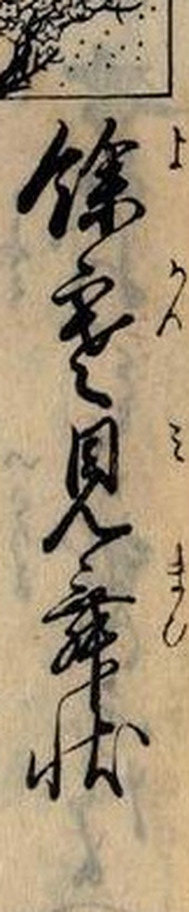餘寒見舞状
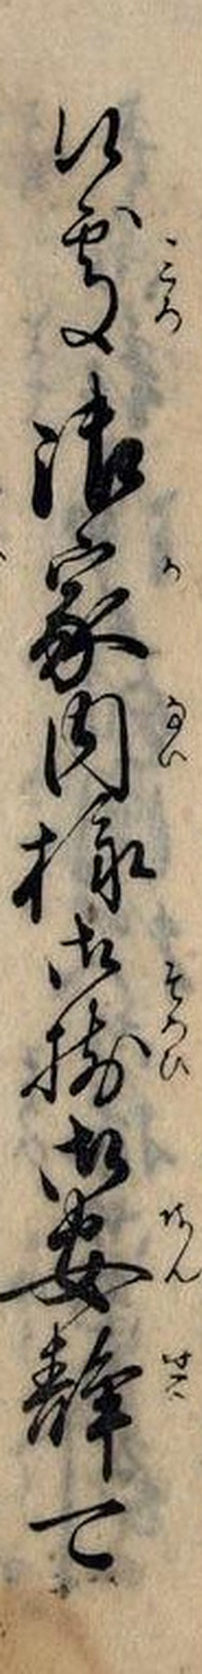候處御家内様御揃御安静可
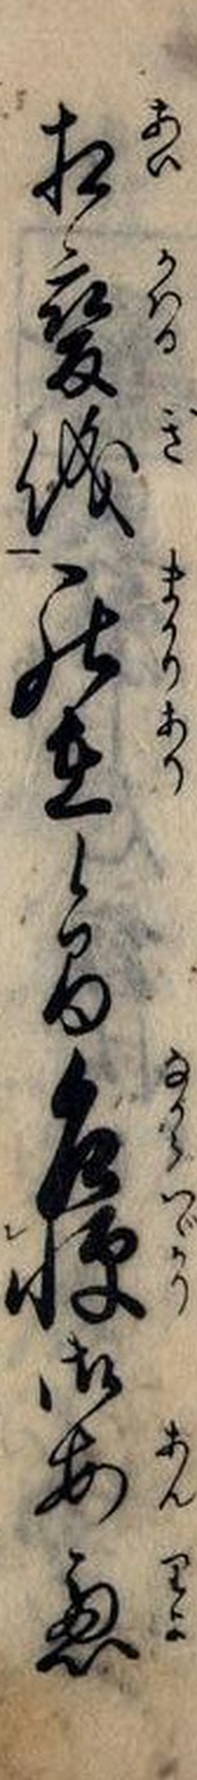相變儀罷在候間乍憚御安慮

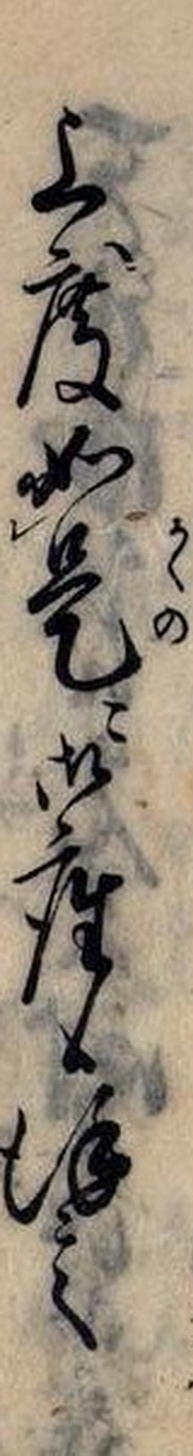上度如是に御座候謹言
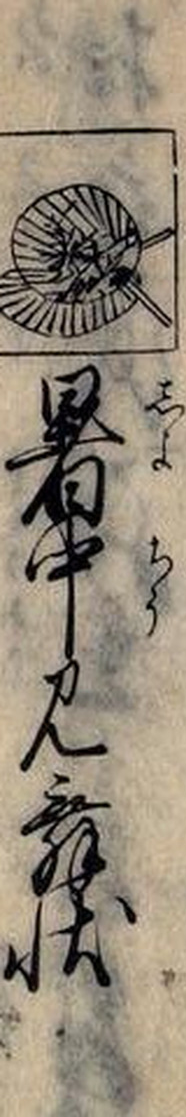暑中見舞状
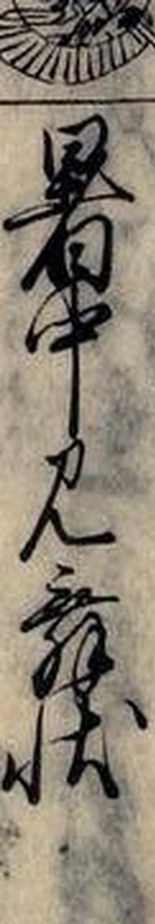暑中見舞状
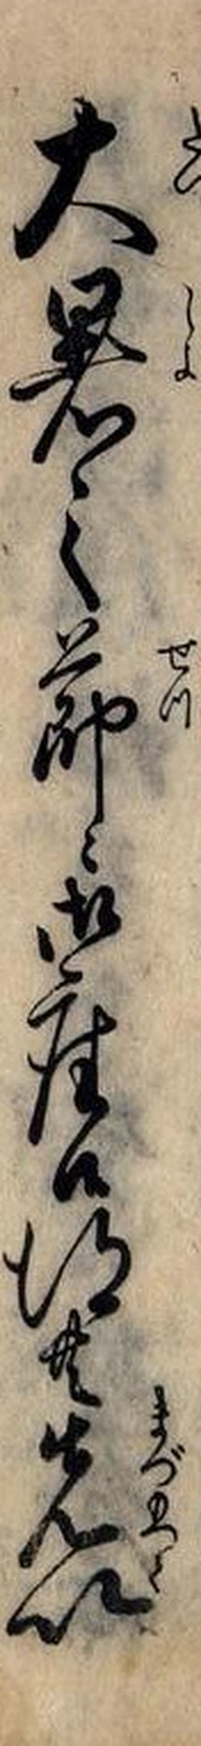大暑之節に御座候得共先以
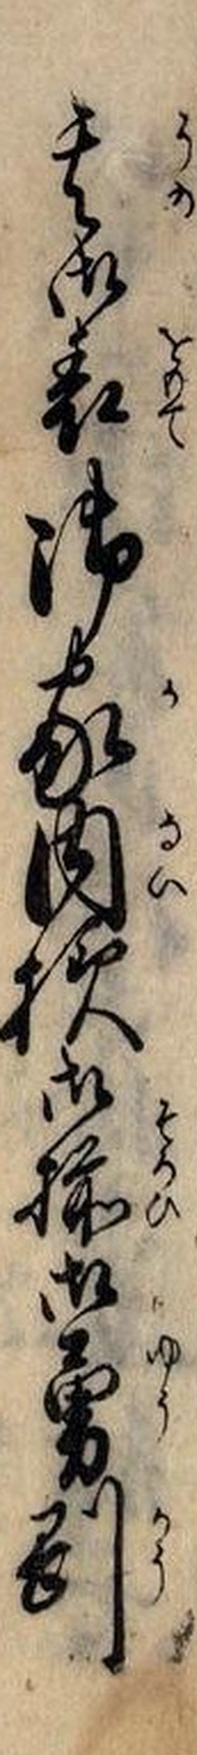其御表御家内様御揃御勇剛
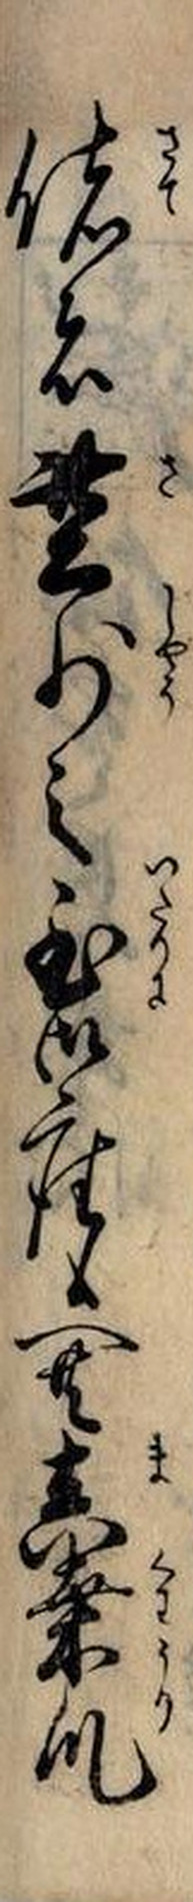偖者些少之至御座候へ共真桑瓜
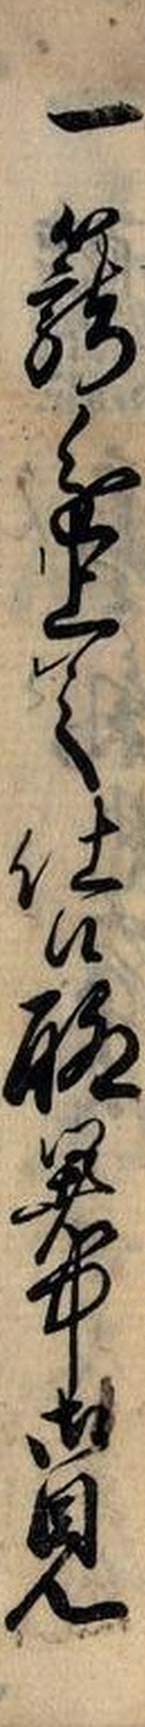一籠進-上之仕候聊暑中御見
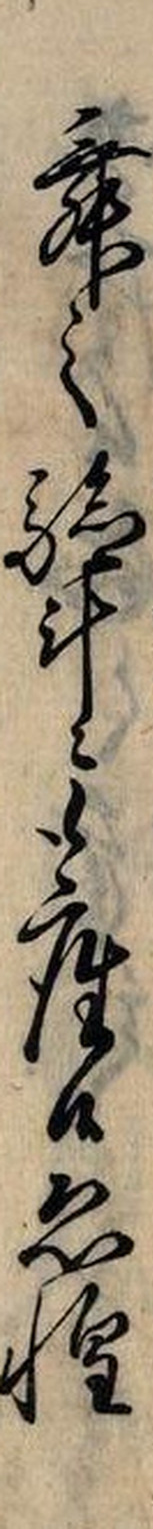舞之験斗に御座候恐惶
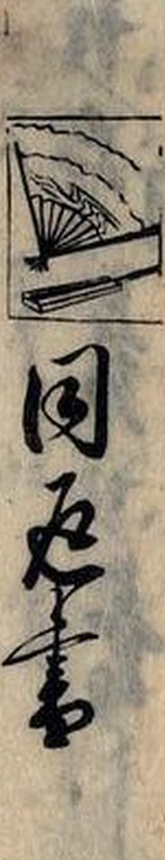同返書
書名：大成用文章（往来物）
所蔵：福井県文書館 Fukui Prefectural Archives
